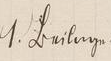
C. Baur.
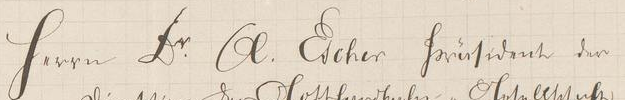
Herrn Dr A. Escher Präsident der
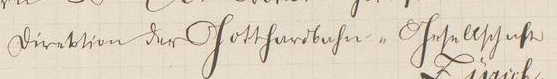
Direktion der Gotthardbahn-Gesellschaft
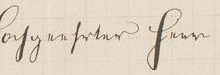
Hochgeehrter Herr!
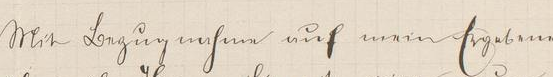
Mit Bezugnahme auf mein Ergebenes
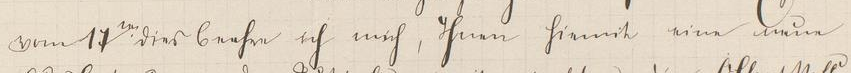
vom 17ten dies beehre ich mich, Ihnen hiemit eine neue
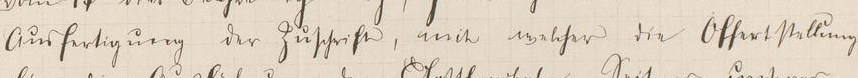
Ausfertigung der Zuschrift, mit welcher die Offertstellung
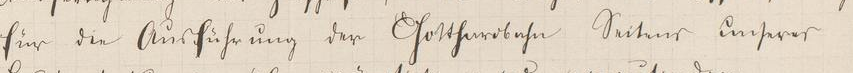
für die Ausführung der Gotthardbahn Seitens unseres
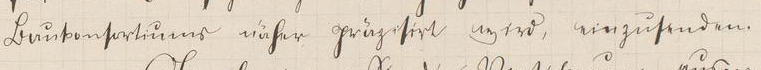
Baukonsortiums näher präzisirt wird, einzusenden.
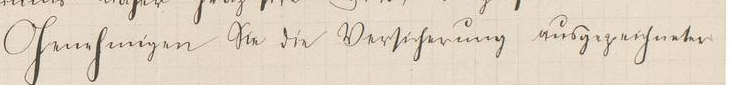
Genehmigen Sie die Versicherung ausgezeichneter
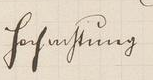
Hochachtung
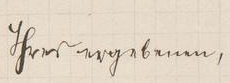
Ihres ergebenen,
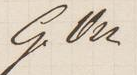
G. Ott
